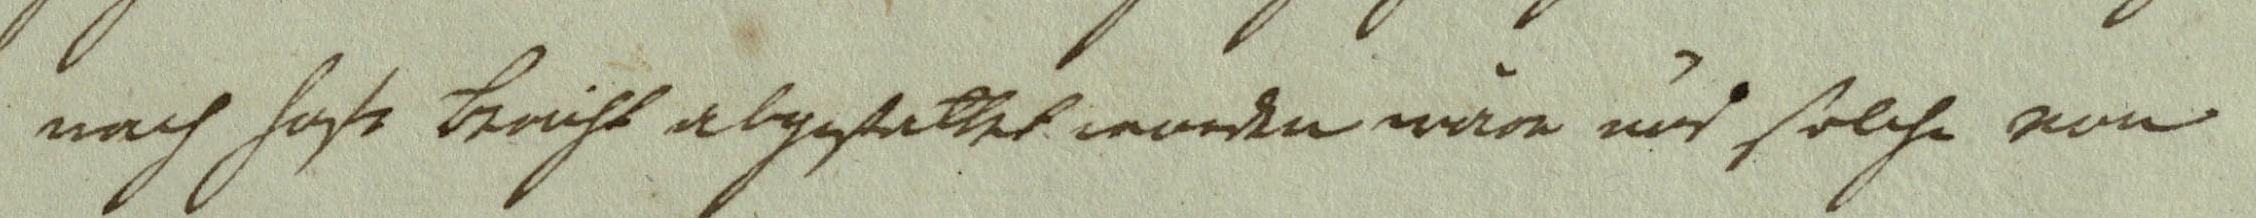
nach Hofe Bericht abgestattet worden wäre und solche von
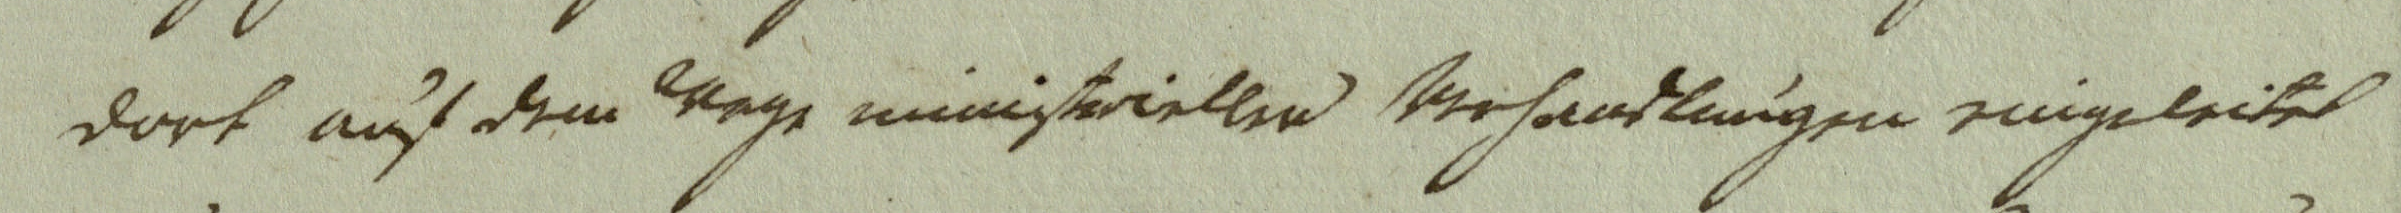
dort auf dem Wege ministerieller Verhandlungen eingeleitet
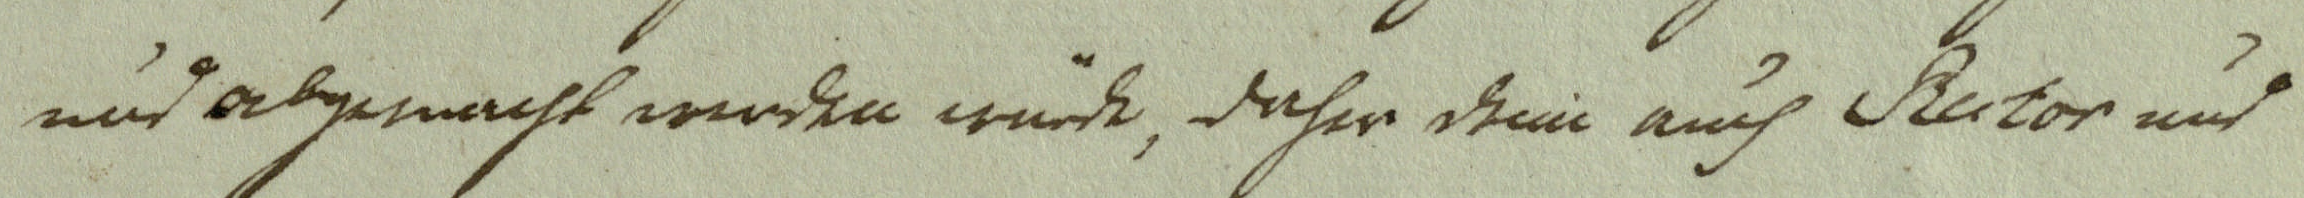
und abgemacht werden würde, daher denn auch Rector und
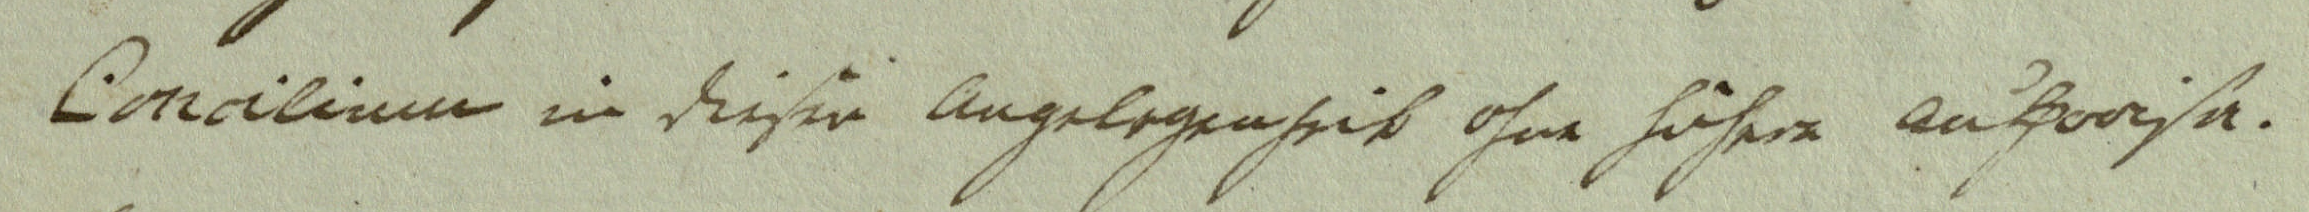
Concilium in dieser Angelegenheit ohne höhere Authorisa¬
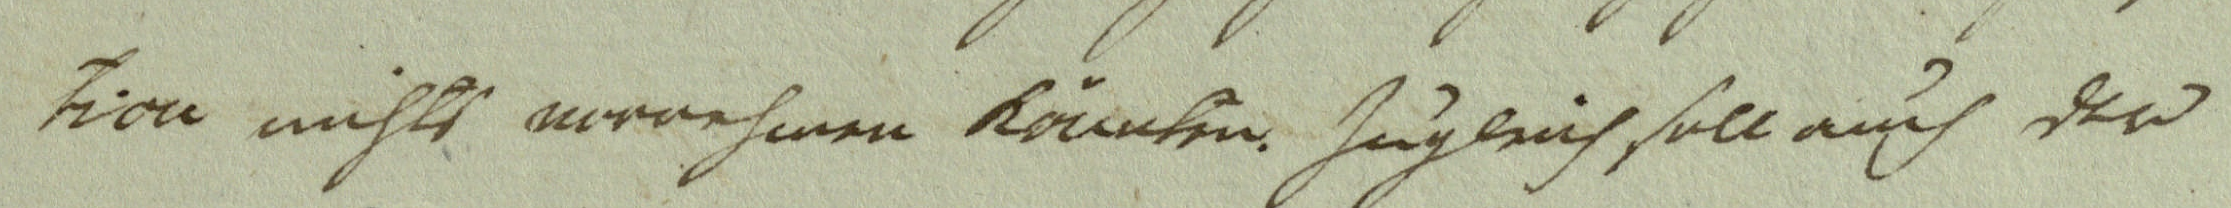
tion nichts vornehmen könnten. Zugleich soll auch der
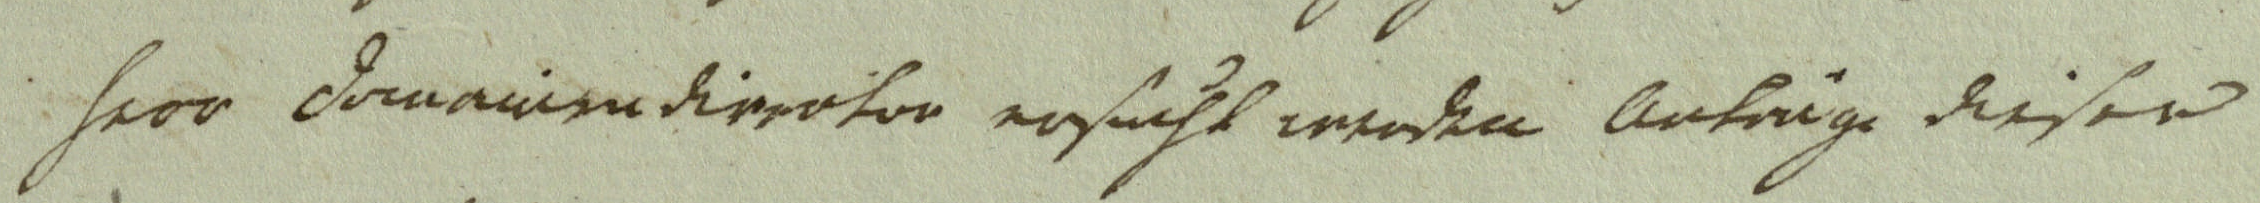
Herr Domainendirector ersucht werden Anträge dieser
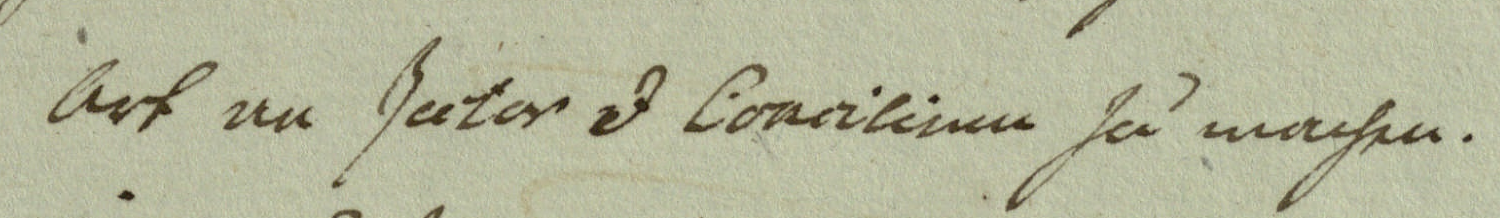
Art an Rector et Concilium zu machen.
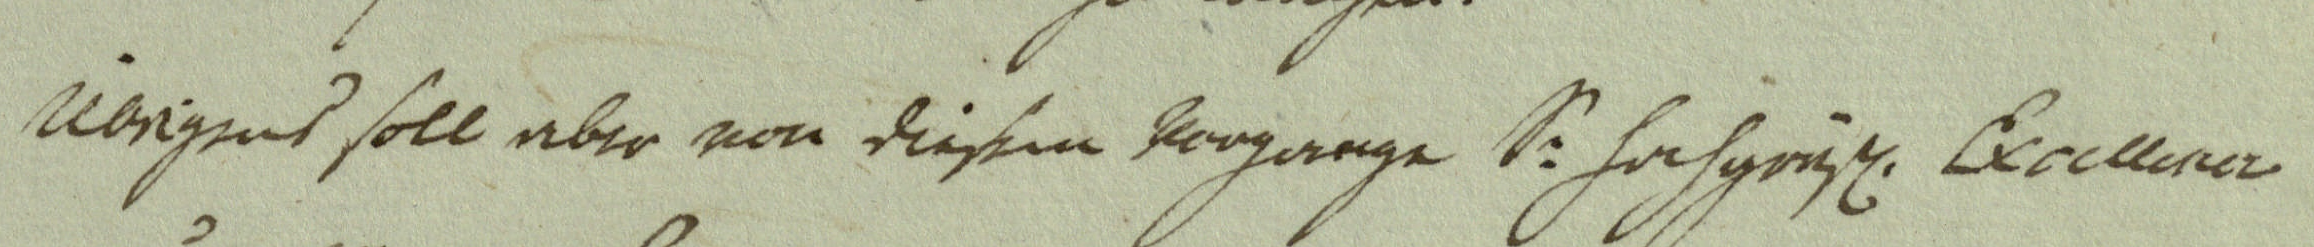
Übrigens soll aber von diesem Vorgange Sr. Hochgräfl. Excellence
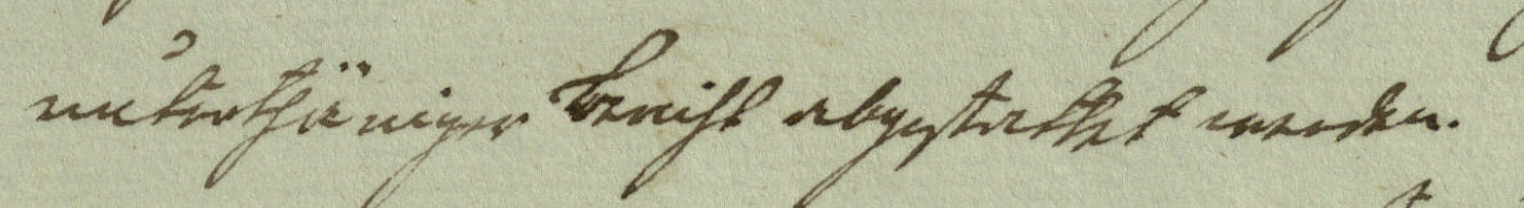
unterthäniger Bericht abgestattet werden.
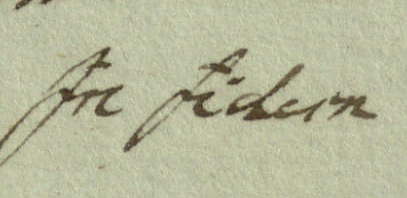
In fidem
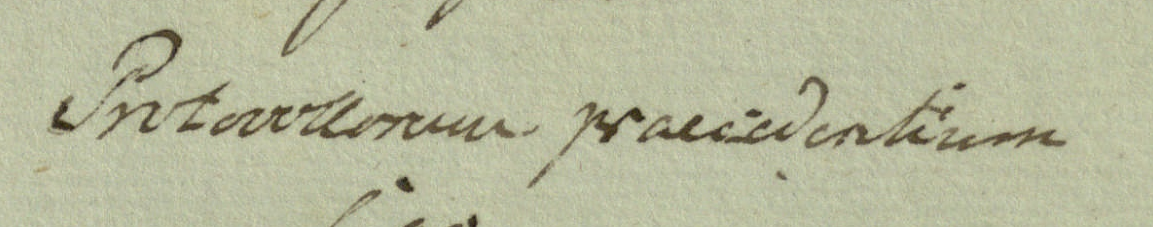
Protocollorum praecedentium
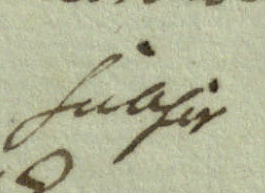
subsi.
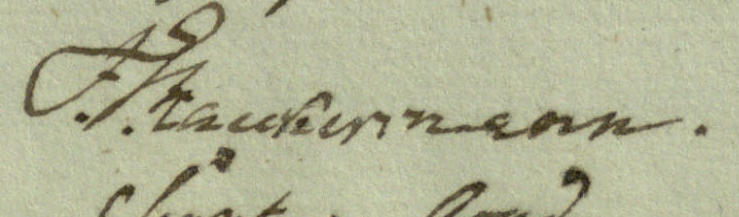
J. Haeckermann
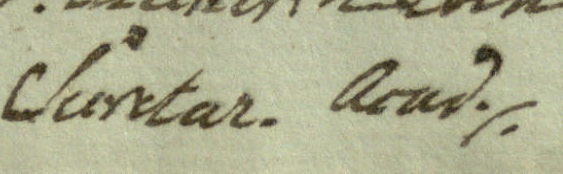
Secretar. Acad.
